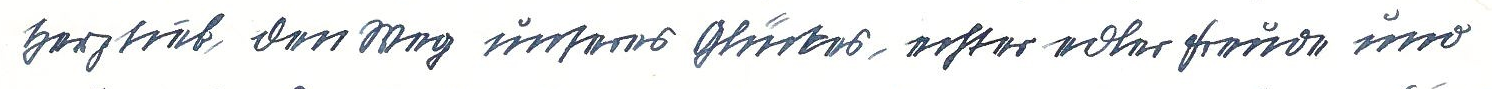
Herzlieb, den Weg unseres Glückes, echter edler Freude und
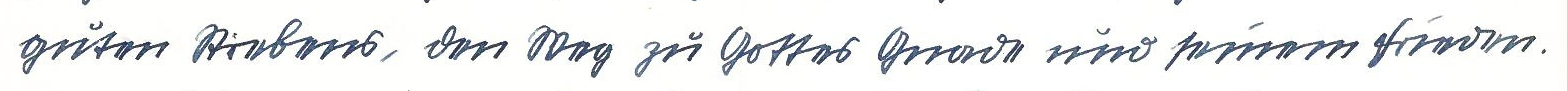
guten Strebens, den Weg zu Gottes Gnade und seinem Frieden.
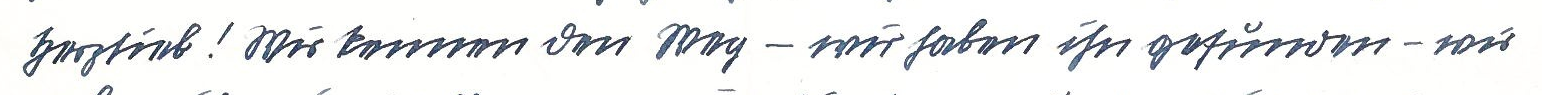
Herzlieb! Wir kennen den Weg – wir haben ihn gefunden – wir
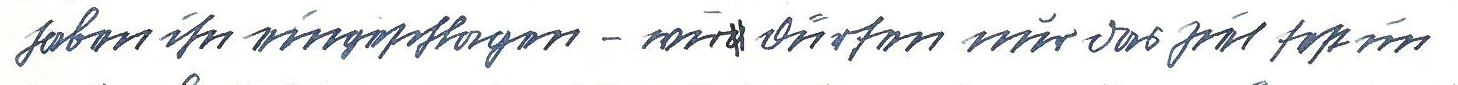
haben ihn eingeschlagen – wird dürfen nur das Ziel fest im
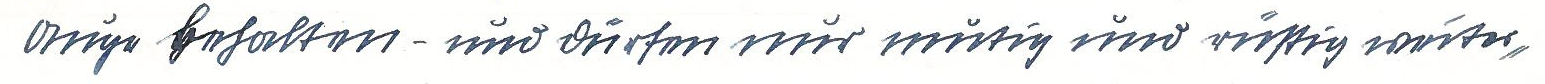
Auge hbehalten – und dürfen nur mutig und rüstig weiter¬
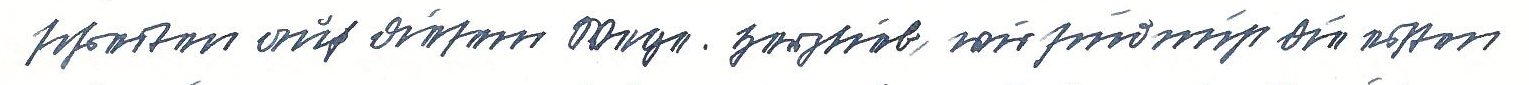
schreiten auf diesem Wege. Herzlieb, wir sind nicht die ersten
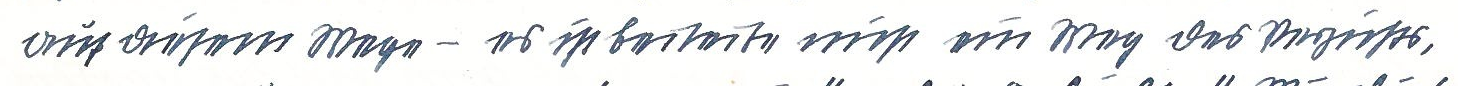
auf diesem Wege – es ist beiseite nicht ein Weg des Verzichts,
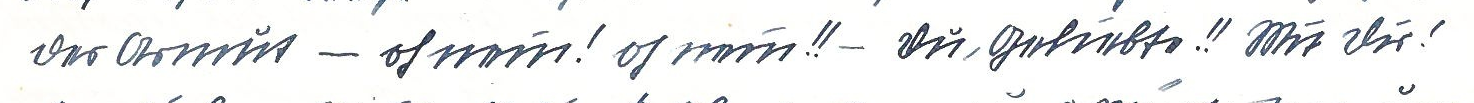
der Armut – oh nein! oh nein!! – Du, Geliebte!! Mit Dir!
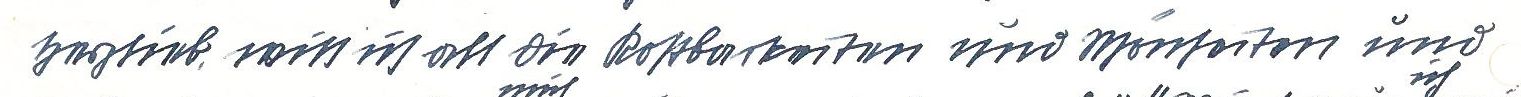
Herzlieb, will ich all die Kostbarkeiten und Schönheiten und
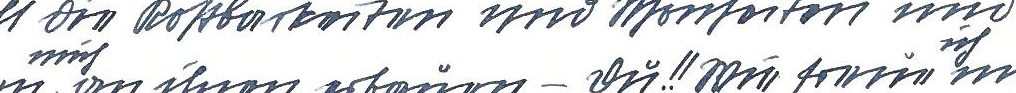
mich ich
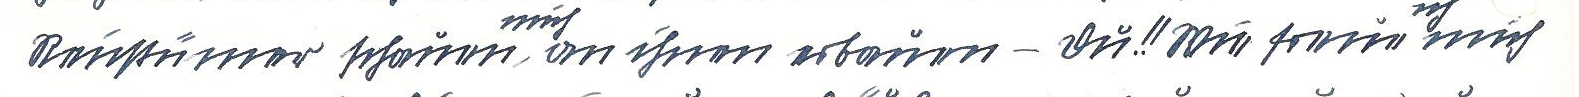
Reichtümer schauen, an ihnen erbauen – Du!! Wie freue mich
